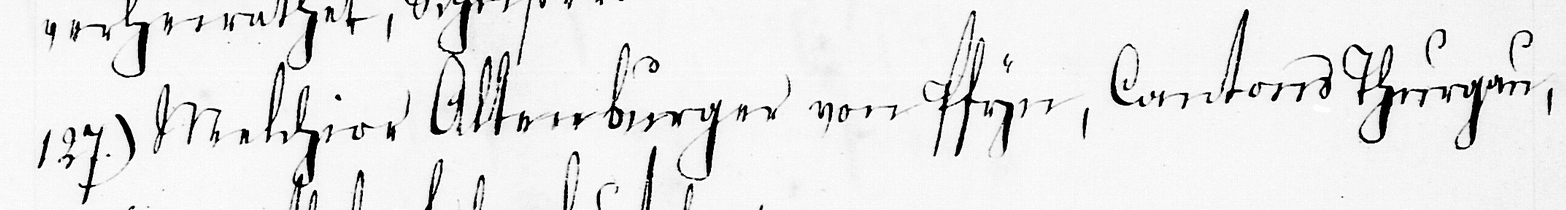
127.) Melchior Altenburger von Pfyn, Cantons Thurgau,
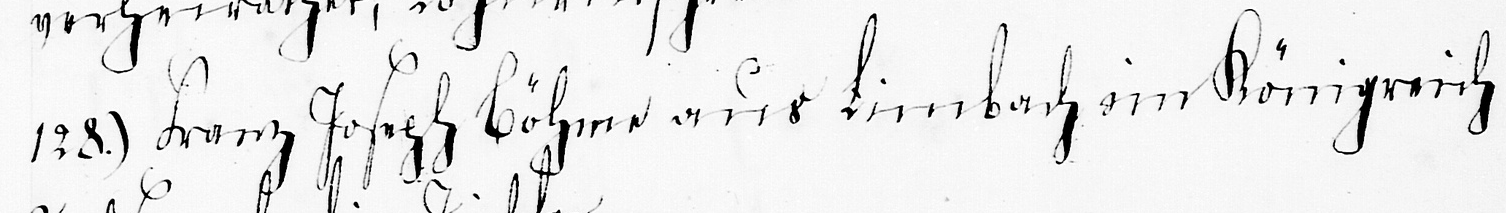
128.) Franz Joseph Böhmer aus Limbach im Königreich
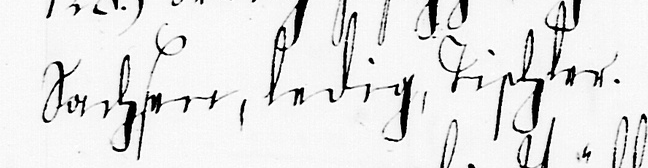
Sachsen, ledig, Tischler.
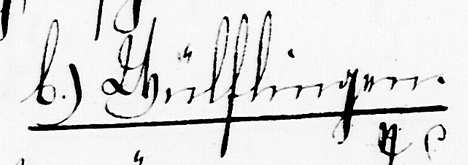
b.) Wülflingen.
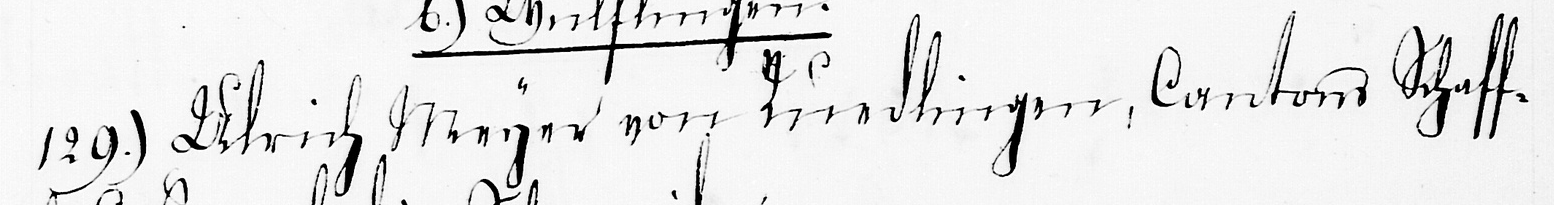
129.) Ulrich Meyer von Ruedlingen, Cantons Schaff¬
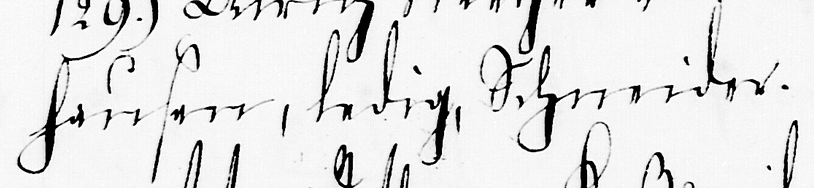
hausen, ledig, Schneider.
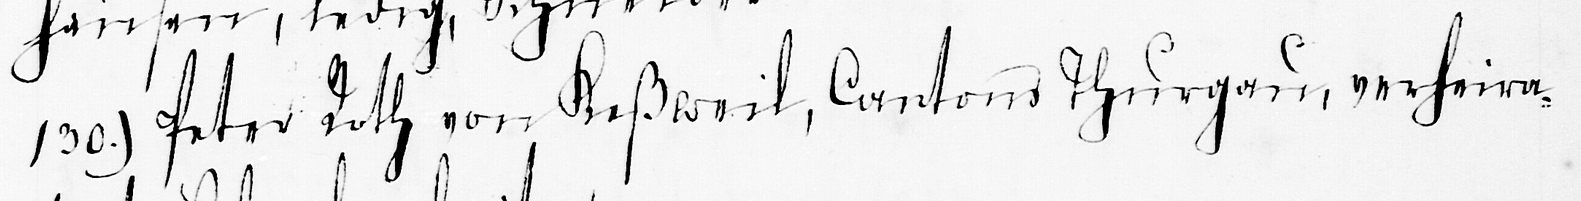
130.) Peter Roth von Keßweil, Cantons Thurgau, verheira¬
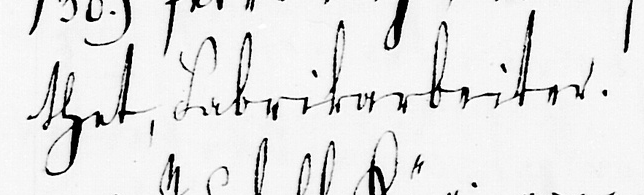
thet, Fabrikarbeiter.
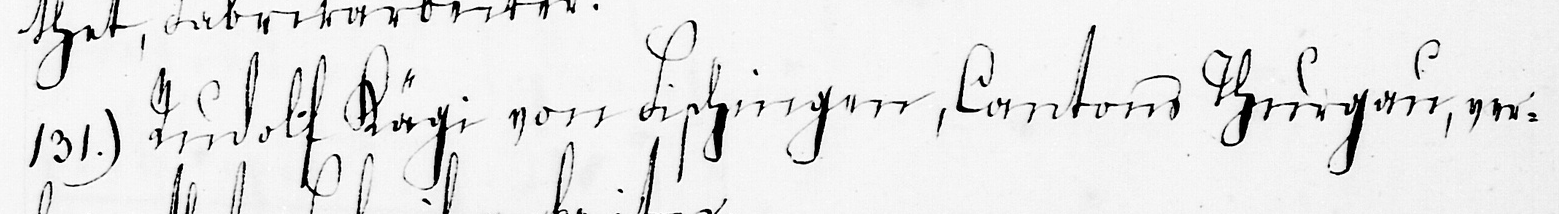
131.) Rudolf Kägi von Fischingen, Cantons Thurgau, ver¬
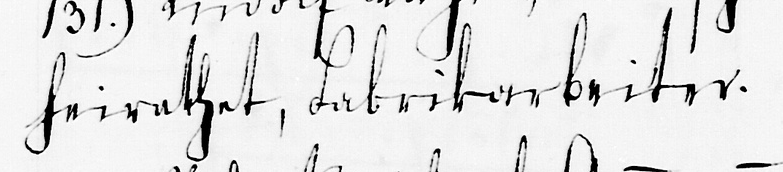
heirathet, Fabrikarbeiter.
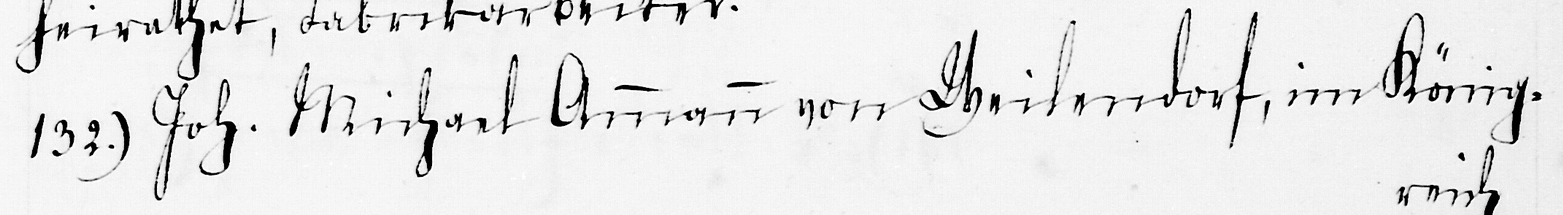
132.) Joh. Michael Ammann von Weilendorf, im König-
